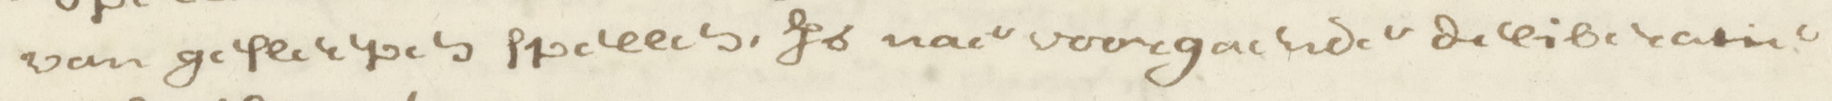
van gesleepen spellen, Is nae voorgaende deliberatie
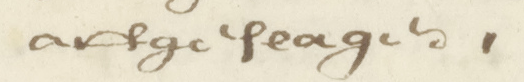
affgeslagen.
